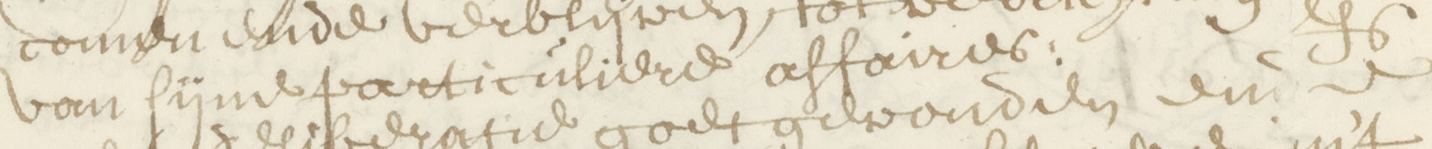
van sijne particuliere affaires. Is
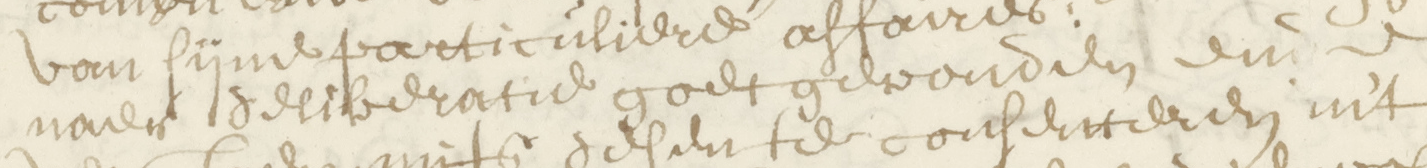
naer deliberatie goetgevonden ende
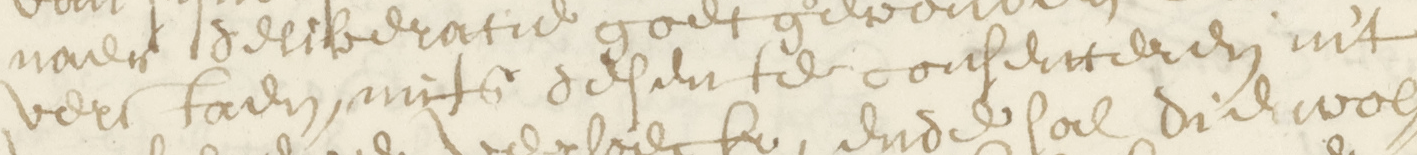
verstaen, mits desen te consenteren in't
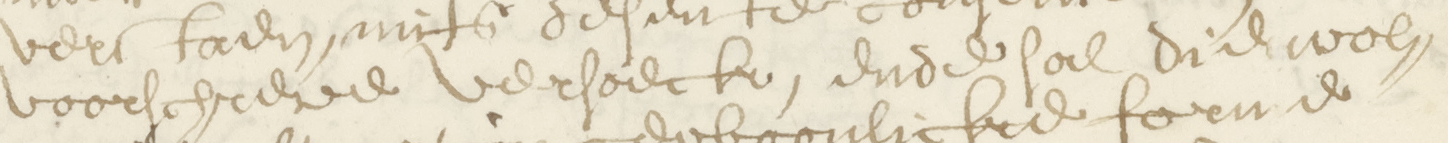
voorschreve versoeck, ende sal dienvol,,
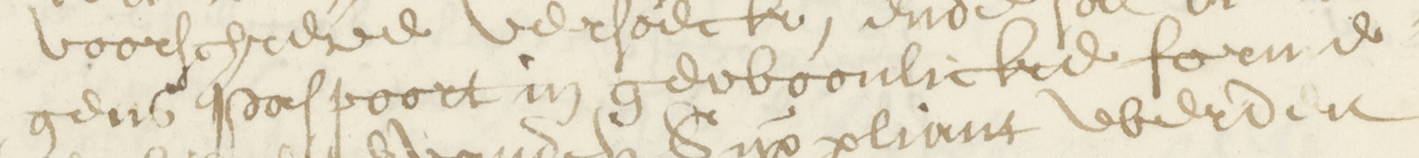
gens paspoort in gewoonlicke forme
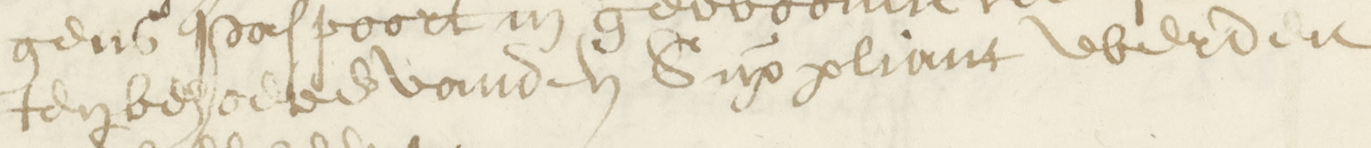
ten behoeve vanden Suppliant werden
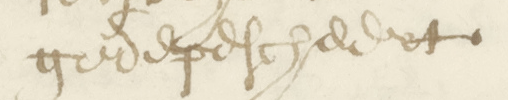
gedepescheert.
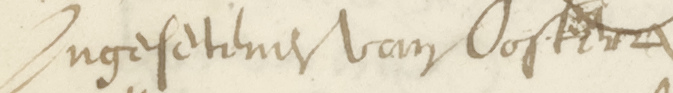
Ingesetenen van Ooster„
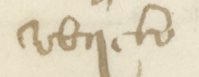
wijck
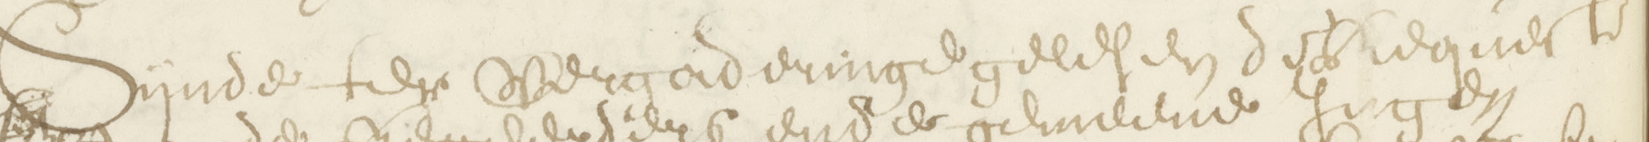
Sijnde ter Vergaderinge gelesen de Requeste
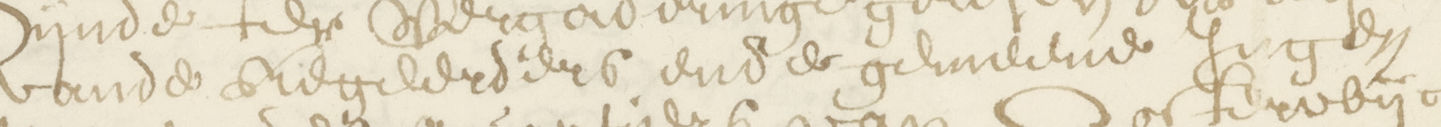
vande Regeerders ende gemeene Inge„
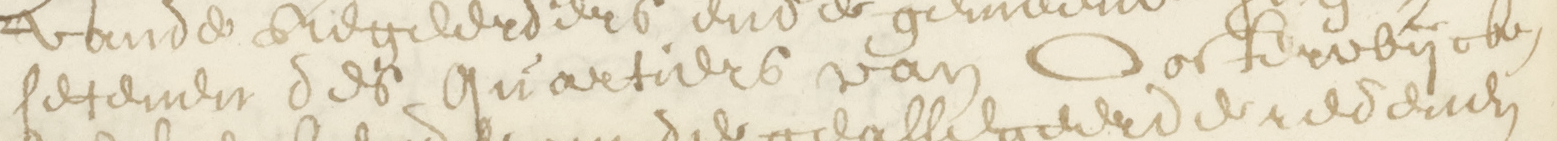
setenen des quartiers van Oosterwijck,
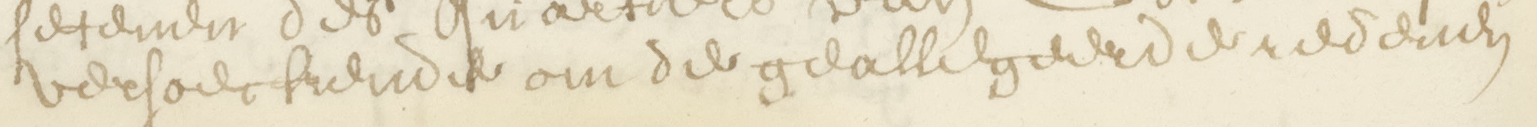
versoeckende om de geallegeerde redenen
